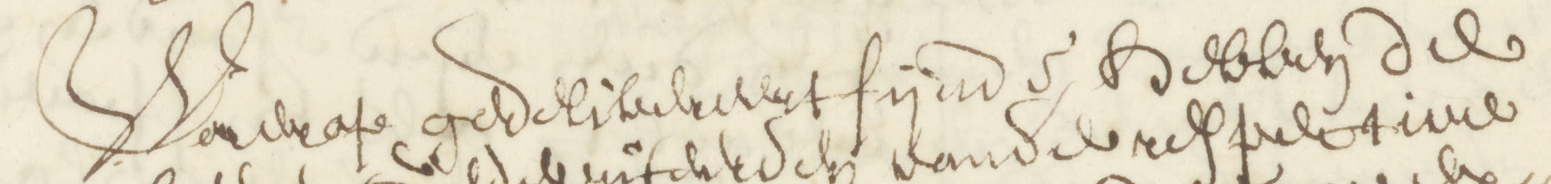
Waerop gedelibereert sijnde, hebben de
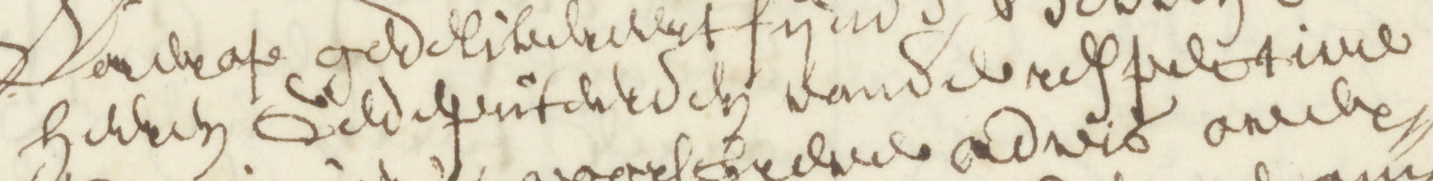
heeren Gedeputeerden vande respective
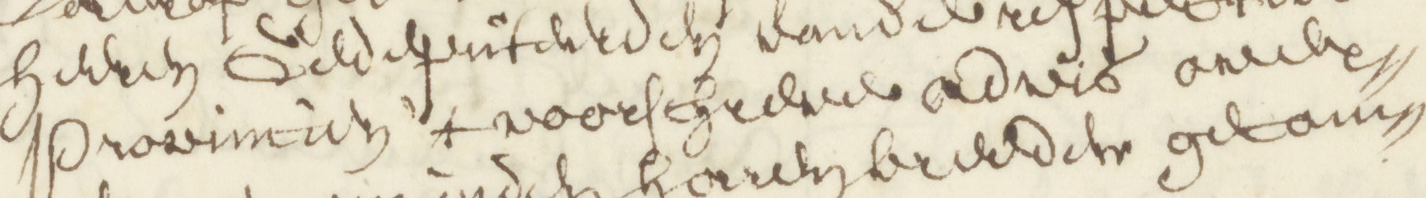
Provincien 't voorschreve advis over„
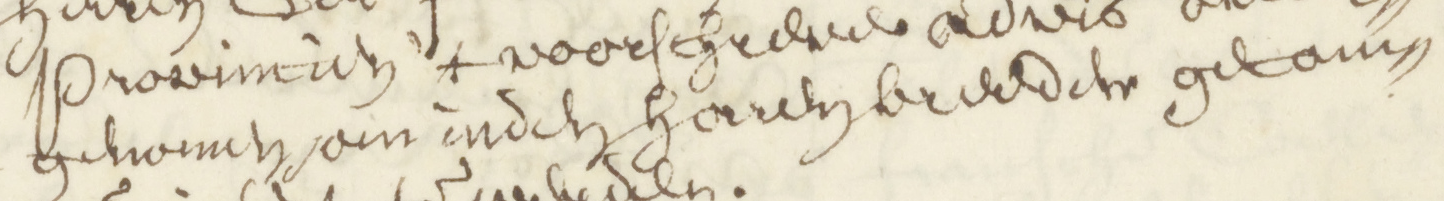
genomen, om inden haren breeder gecom„
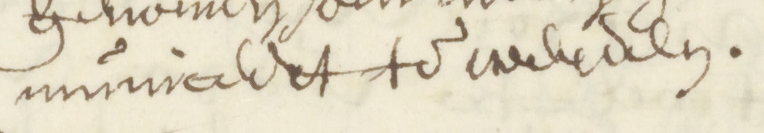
municeert te werden.
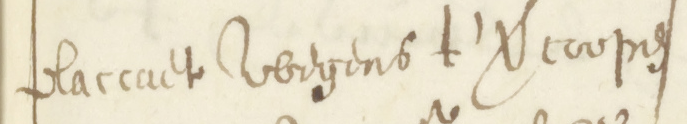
placcaet wegens t' Vcoopen
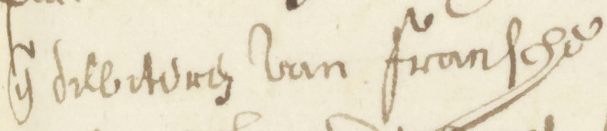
& debiteren van fransche
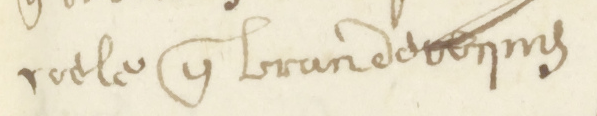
coele & brandewynen
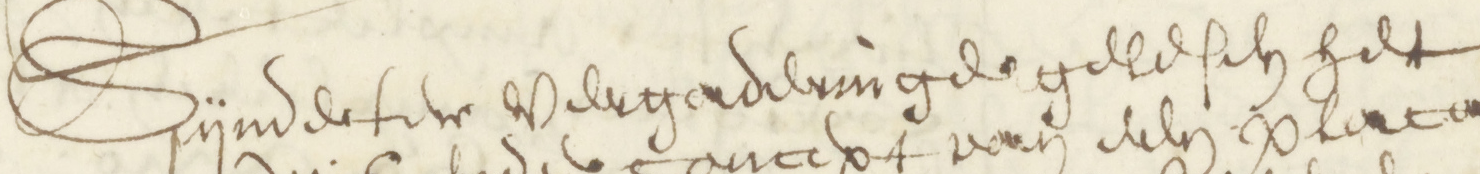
Sijnde ter Vergaderinge gelesen het
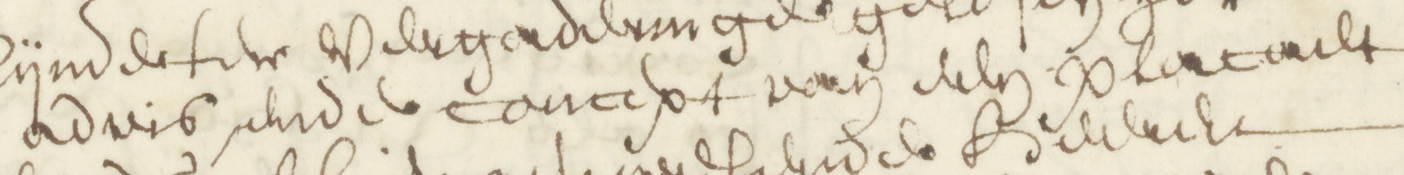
advis, ende concept van een placaet
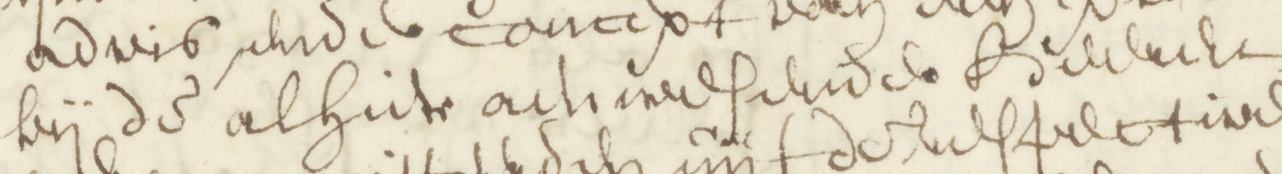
bij de alhier aenwesende Heeren
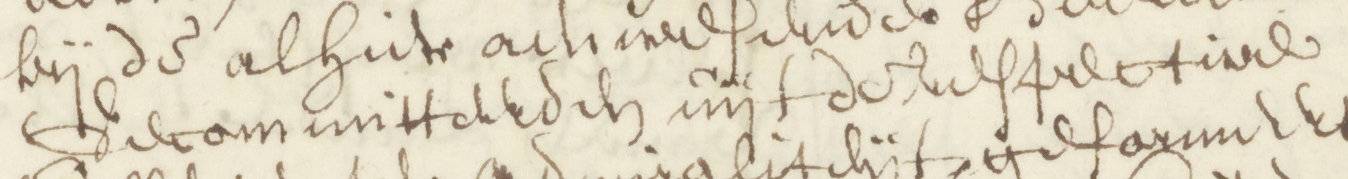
Gecommitteerden uijt de respective
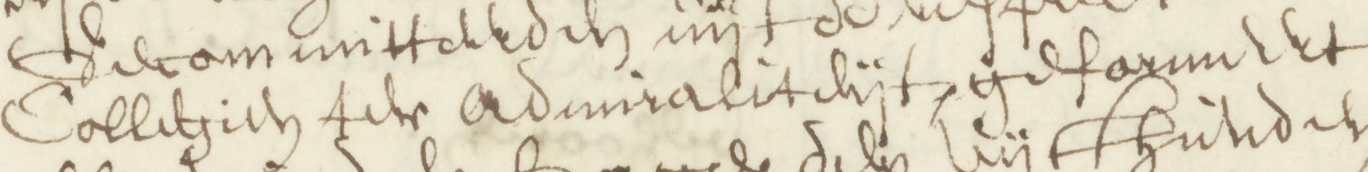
Collegien ter Admiraliteijt, geformeert
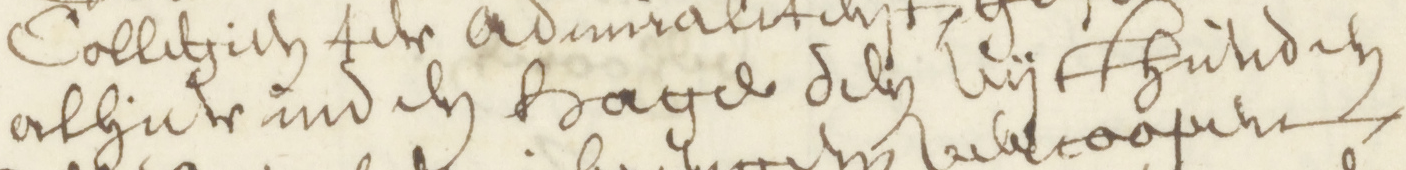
alhier inden Hage den vijfthienden
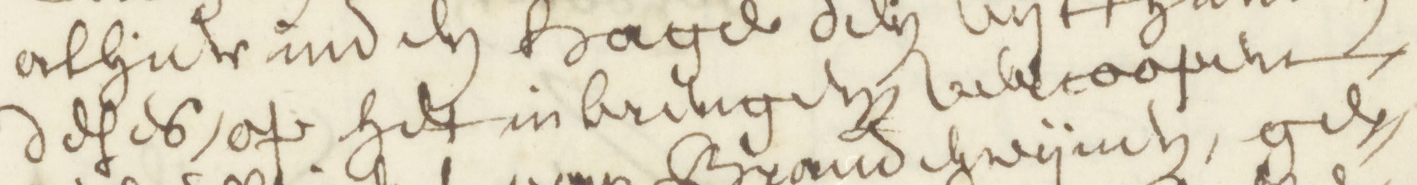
deses, op het inbrengen, vercoopen
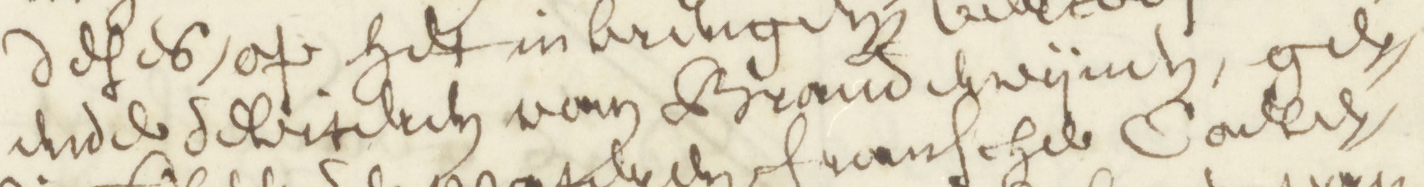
ende debiteren van Brandewijnen, ge,,
